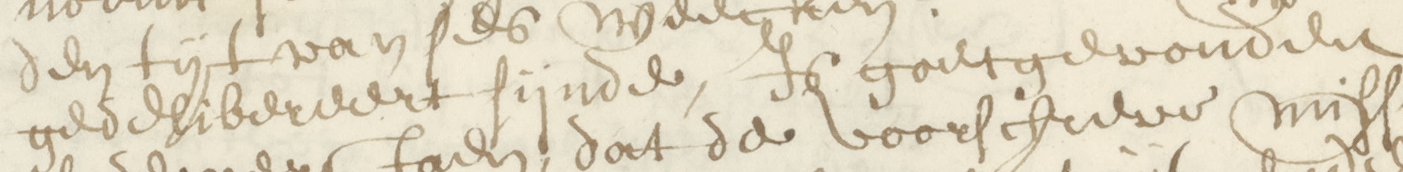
gedelibereert sijnde, Is goetgevonden
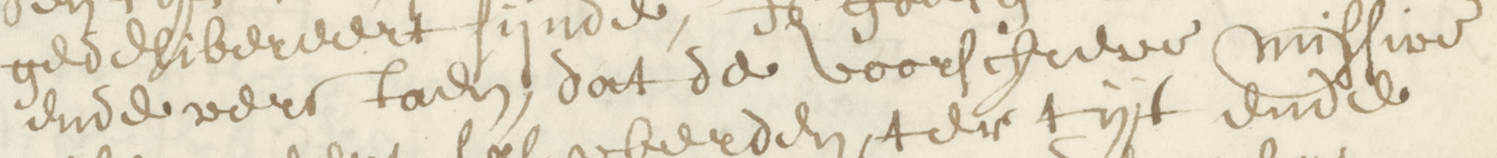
ende verstaen, dat de voorschreve missive
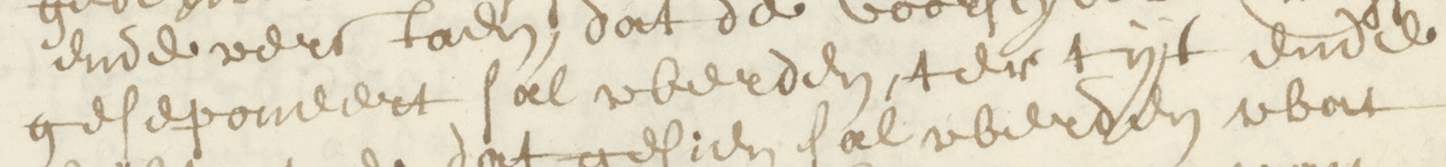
geseponeert sal werden, ter tijt ende
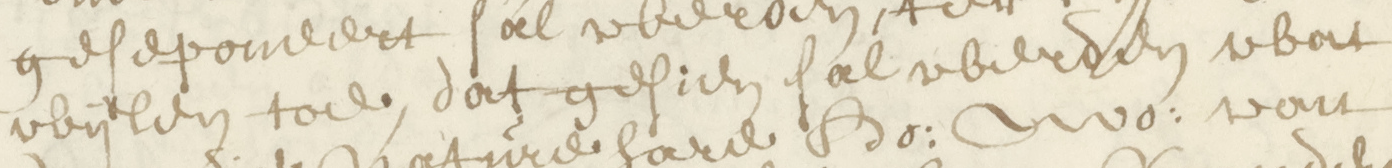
wijlen toe, dat gesien sal werden wat
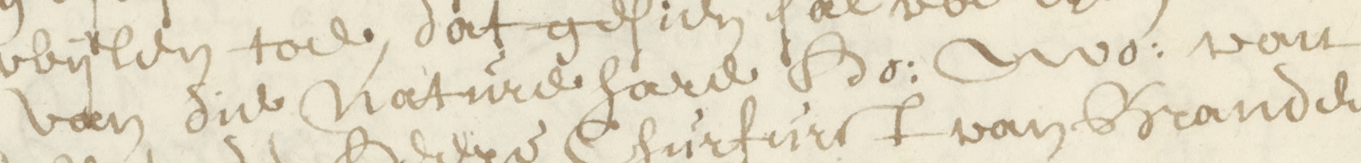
van die nature hare Ho:Mo: van
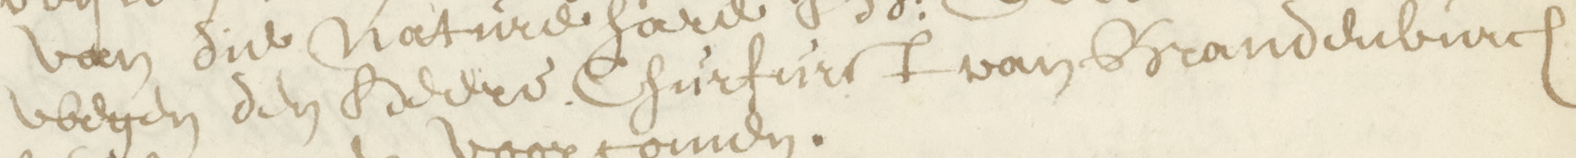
wegen den Heere Churfurst van Brandenburch
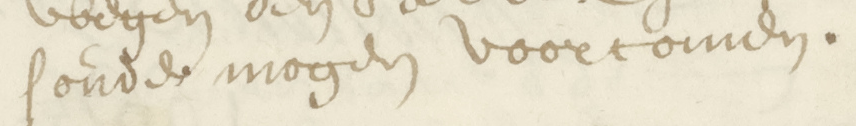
soude mogen voorcomen.
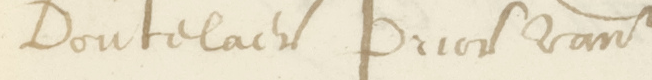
Doutelaer Prior van
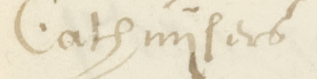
Cathuijsers
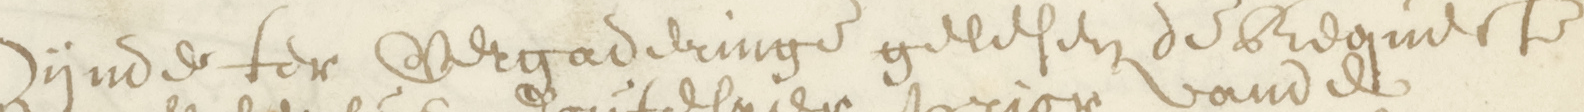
Sijnde ter Vergaderinge gelesen de Requeste
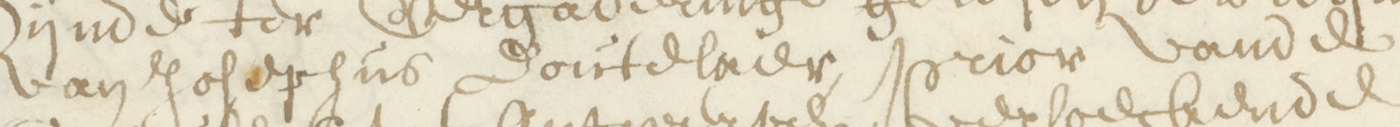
van Josephus Doutelaer, prior vande
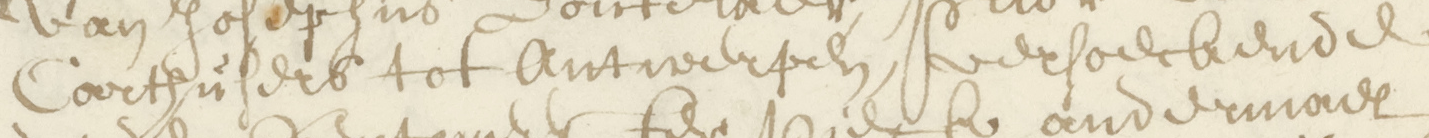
Carthusers tot Antwerpen, versoeckende
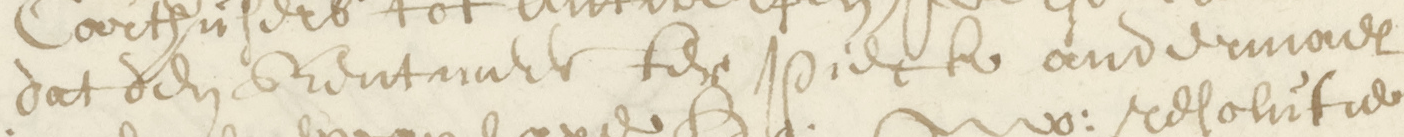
dat den Rentnaer ter Pieck andermael
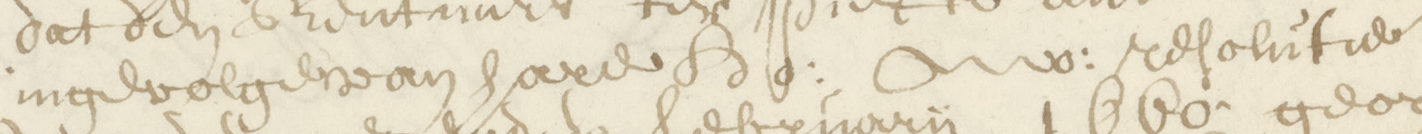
ingevolge van hare Ho:Mo: resolutie
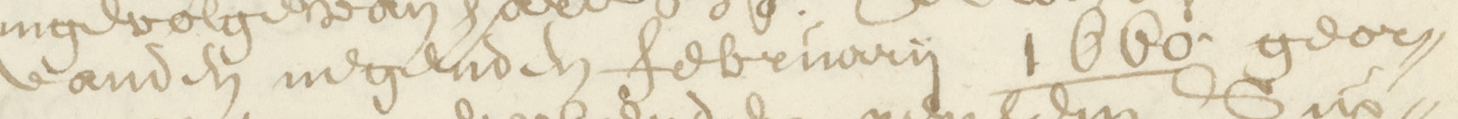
vanden negenden februarij 1660 geor„
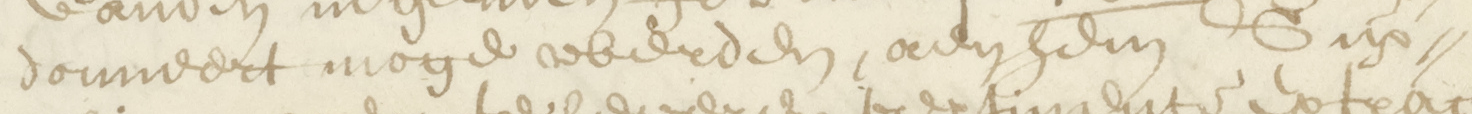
donneert moge werden, aen hem Sup„
